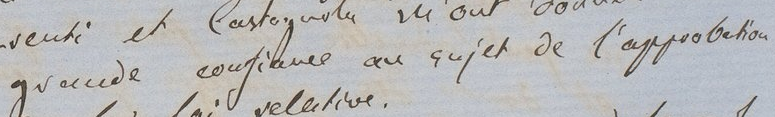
grande confiance au sujet de l'approbation
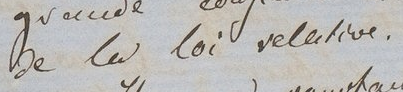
de la loi relative.
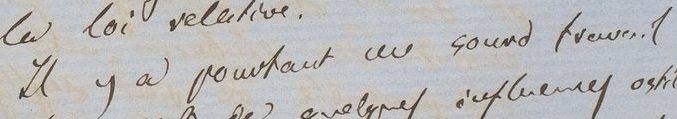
Il y a pourtant un sourd travail
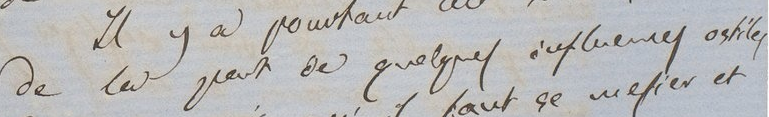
de la part de quelques influences ostiles
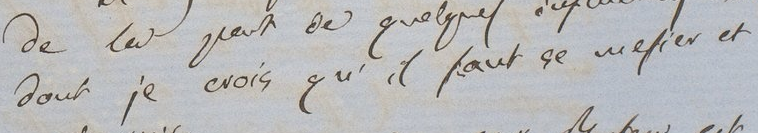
dont je crois qu'il faut se mefier et
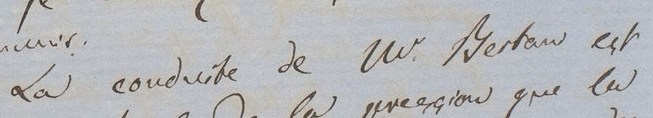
La conduite de MrBertani est
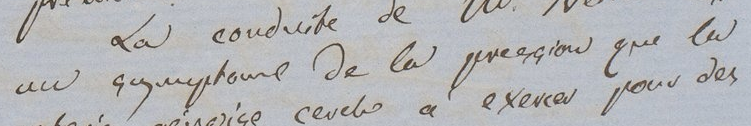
un symptome de la pression que la
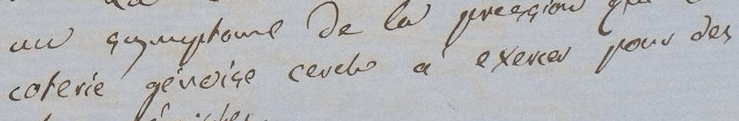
coterie génoise cerche a exercer pour des
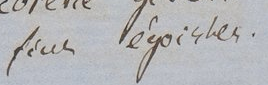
fins égoistes.
